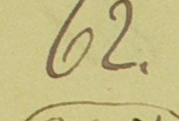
62
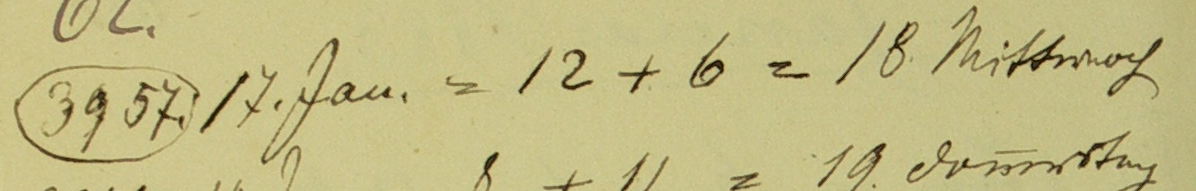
3957 17. Jan. = 12 + 6 = 18 Mittwoch
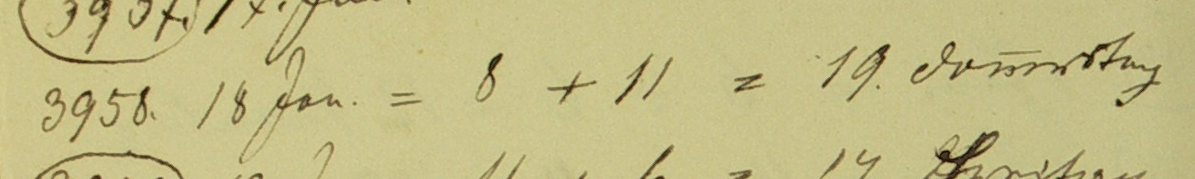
3958 18. Jan. = 8 + 11 = 19 Donnerstag
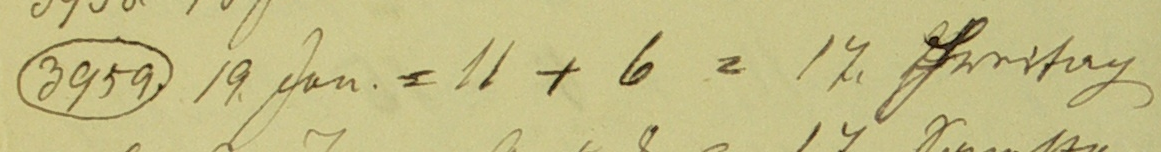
3959 19. Jan. = 11 + 6 = 17 Freitag
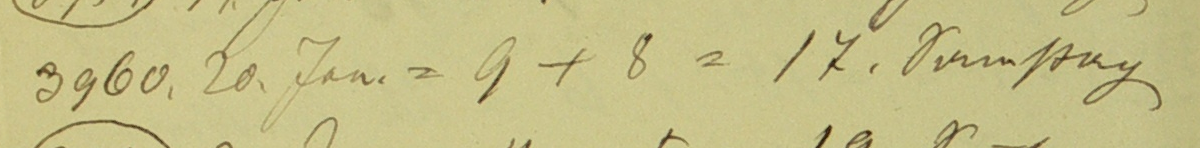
3960 20. Jan. = 9 + 8 = 17 Samstag
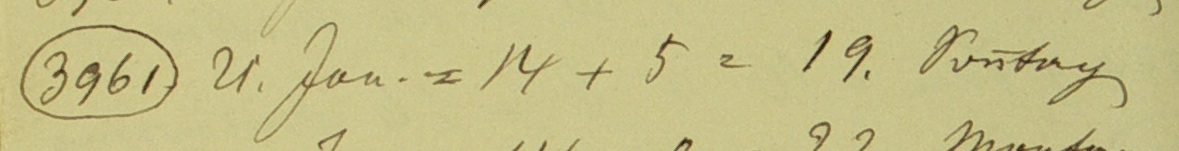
3961 21. Jan. = 14 + 5 = 19 Sonntag
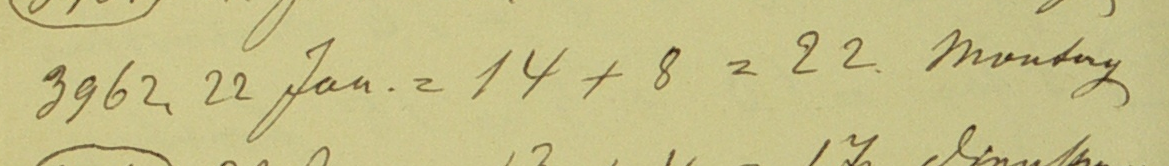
3962 22. Jan. = 14 + 5 = 22 Montag
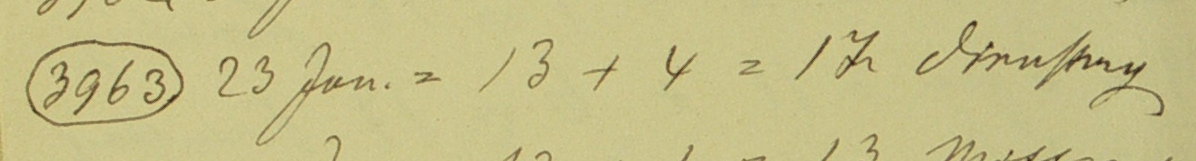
3963 23. Jan. = 13 + 4 = 17 Dienstag
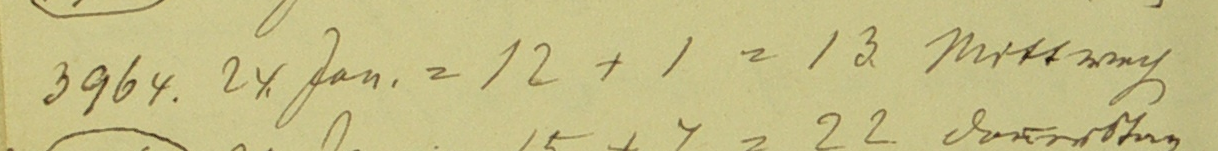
3964 24. Jan. = 12 + 1 = 13 Mittwoch
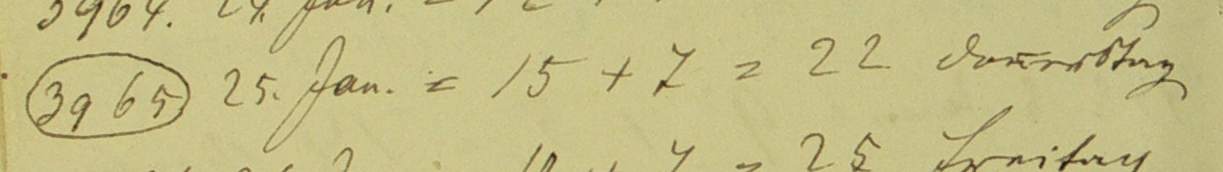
3965 25. Jan. = 15 + 7 = 22 Donnerstag
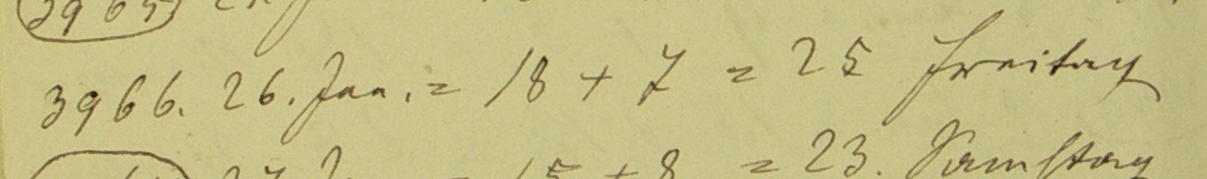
3966 26. Jan. = 18 + 7 = 25 Freitag
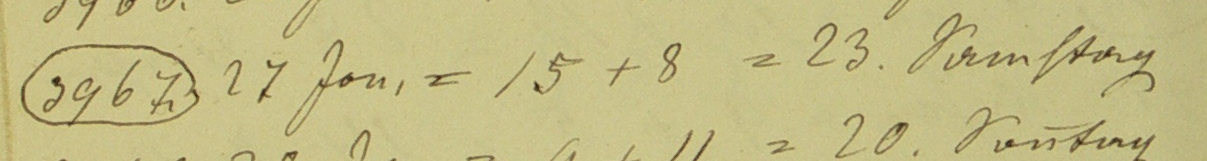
3967 27. Jan. = 15 + 8 = 23 Samstag
